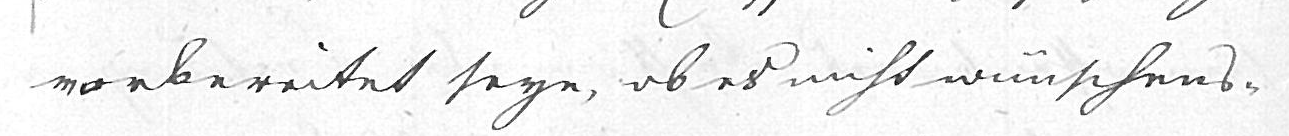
vorbereitet seye, ob es nicht wünschens-
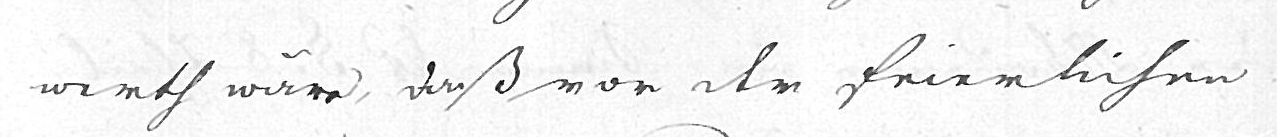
werth wäre, daß vor der feierlichen
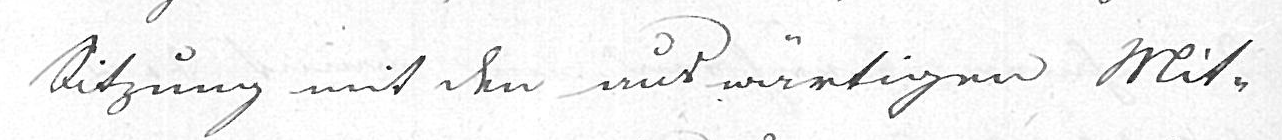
Sitzung mit den auswärtigen Mit-
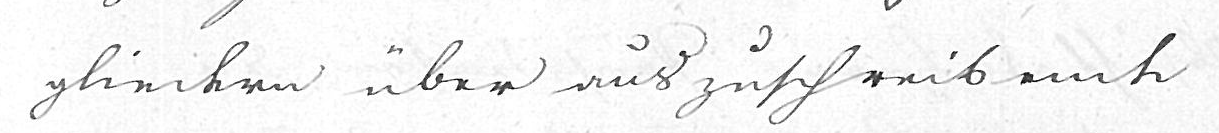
gliedern über auszuschreibende
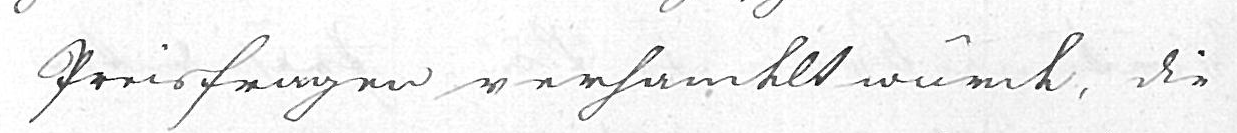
Preisfragen verhandelt wurde, die
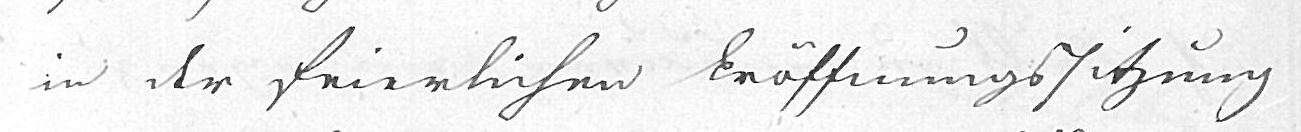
in der feierlichen Eröffnungssitzung
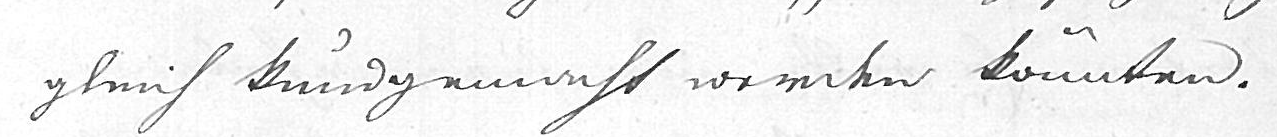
gleich kundgemacht werden könnten.
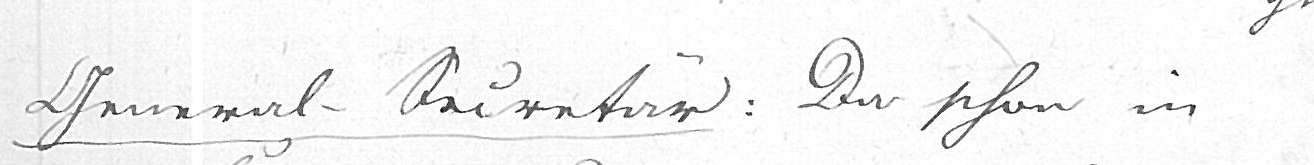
General-Secretär: Da schon in den
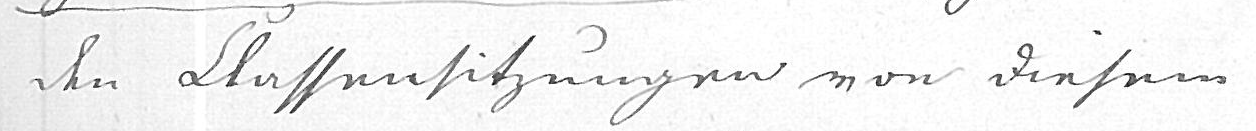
Classensitzungen von diesem
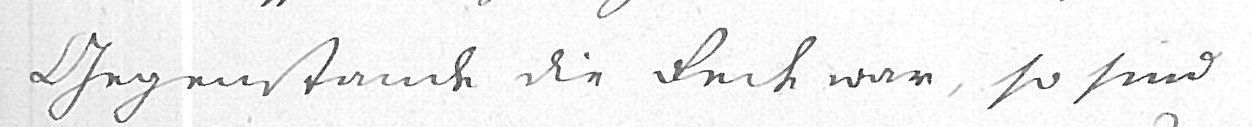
Gegenstande die Rede war, so sind
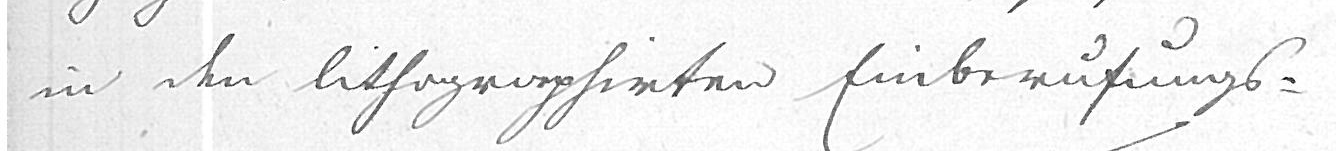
in den lithographirten Einberufungs-
